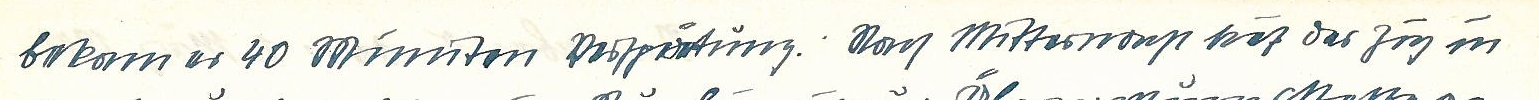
bekam er 40 Minuten Verspätung. Nach Mitternacht lief der Zug in
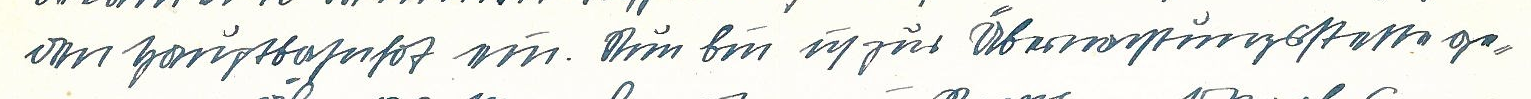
den Hauptbahnhof ein. Nun bin ich zur Übernachtungsstelle ge¬
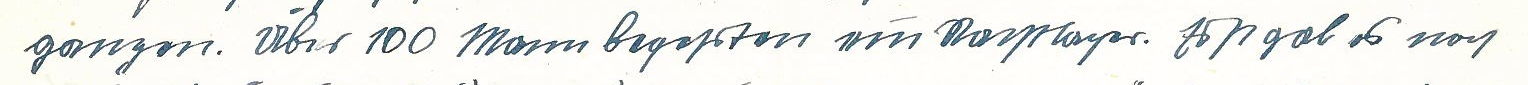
gangen. Über 100 Menschen begehrten ein Nachtlager. Erst gab es noch
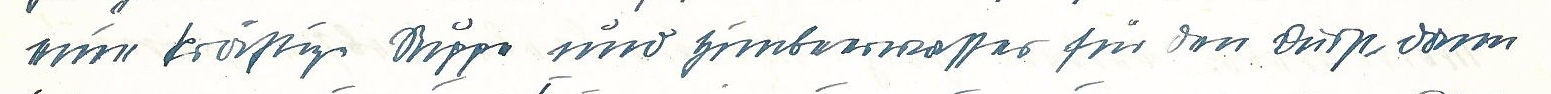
eine kräftige Suppe und Himbeerwasser für den Durst, dann
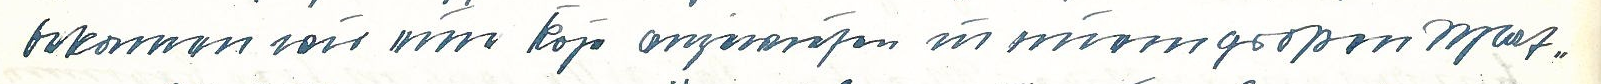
bekamen wir eine Koje angewiesen in einem großen Schlaf¬
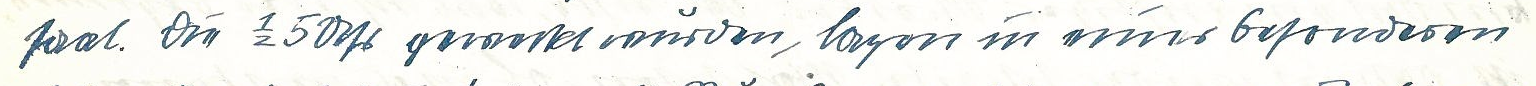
saal. Die ½ 5 Uhr geweckt wurden, lagen in einer besonderen
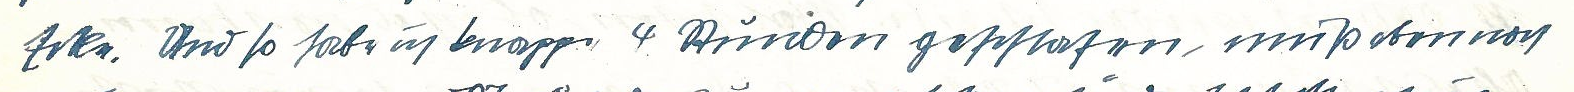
Ecke. Und so habe ich knappe 4 Stunden geschlafen, muß eben noch
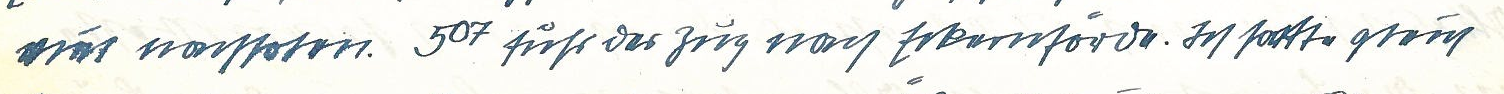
viel nachholen. 507 fuhr der Zug nach Eckernförde. Ich hatte gleich
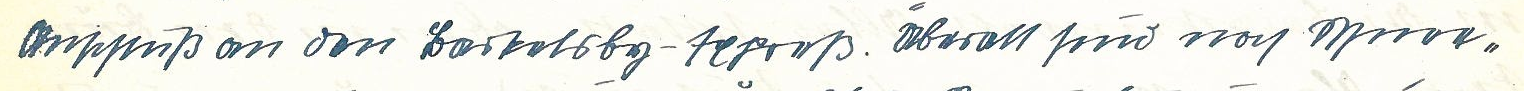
Anschluß an den Barkelsby – Expreß. Überall sind noch Schnee¬
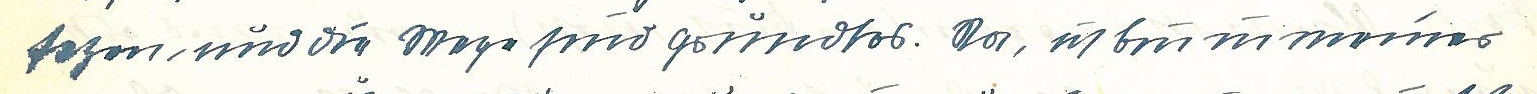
fetzen, und die Wege sind grundlos. Na, ich bin in meiner
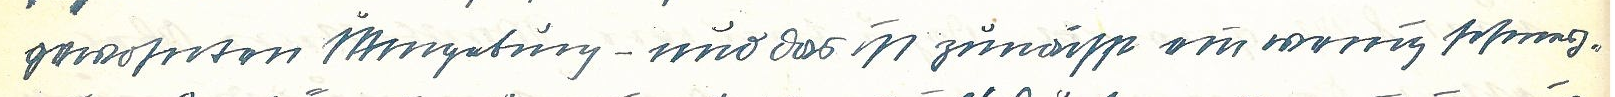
gewohnten Umgebung – und das ist zunächst ein wenig schmerz¬
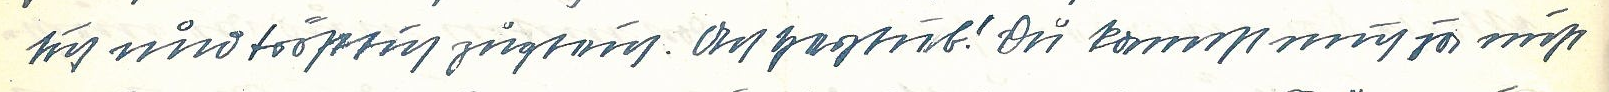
lich und tröstlich zugleich. Ach, Herzlieb! Du kannst mich ja nicht
